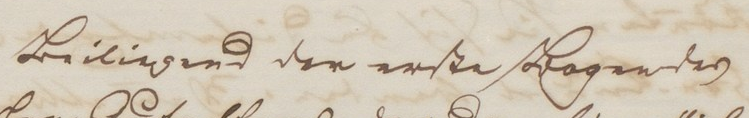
Beiliegend der erste Bogen des
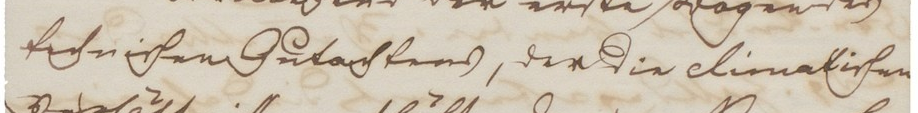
technischen Gutachtens, der die climatischen
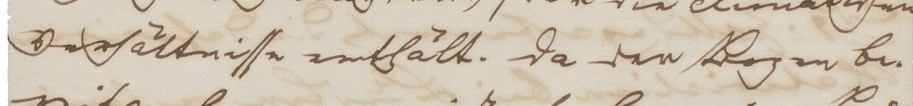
Verhältnisse enthält. Da der Bogen be-
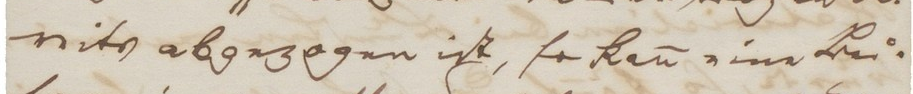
reits abgezogen ist, so kann eine Bei-
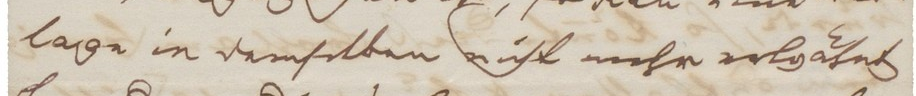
lage in demselben nicht mehr erwähnt
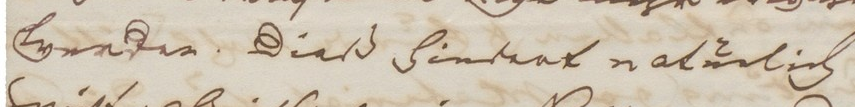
werden. Dieß hindert natürlich
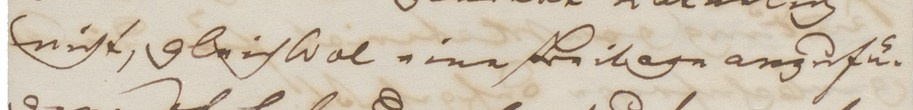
nicht, gleichwol eine Beilage anzufü-
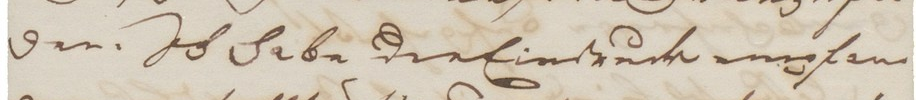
gen. Ich habe den Eindruck empfan-
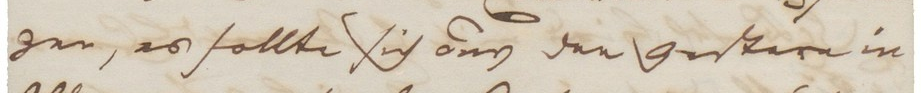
gen, es sollte sich aus den gestern in
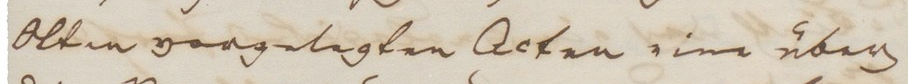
Olten vorgelegten Acten eine über
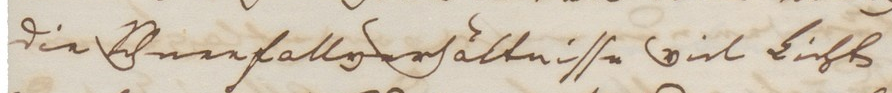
die Schneefallverhältnisse viel Licht
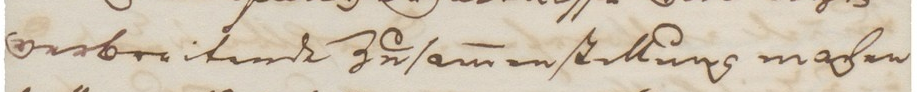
verbreitende Zusammenstellung machen
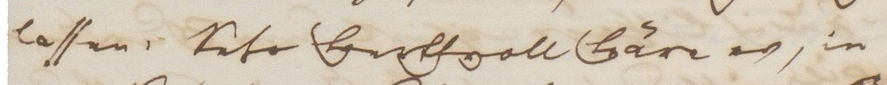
lassen. – Sehr werthvoll wäre es, in
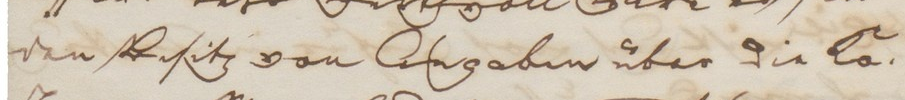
den Besitz von Angaben über die Ko-
